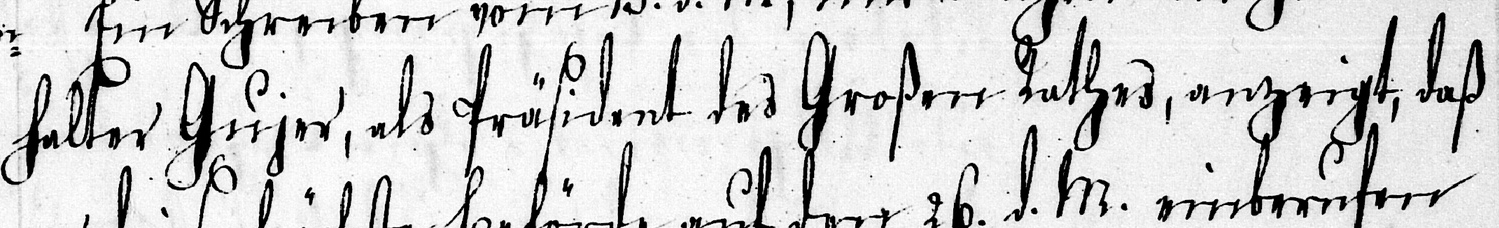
alter Gujer, als Präsident des Großen Rathes, anzeigt, daß
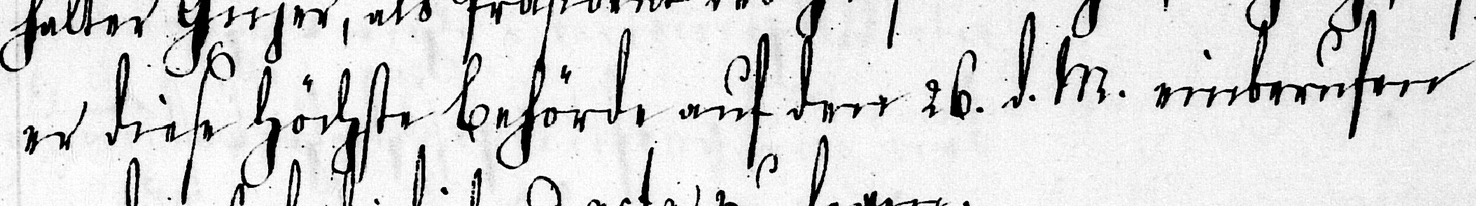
er diese Höchste Behörde auf den 26. d. M. einberufen
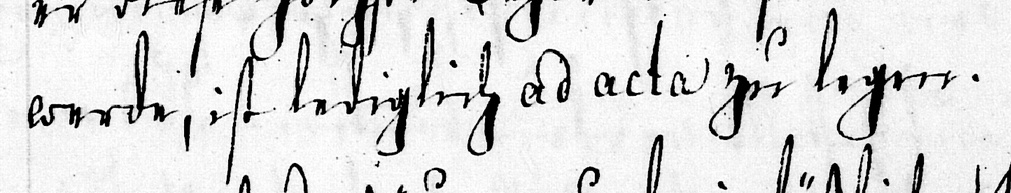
werde, ist lediglich ad acta zu legen.
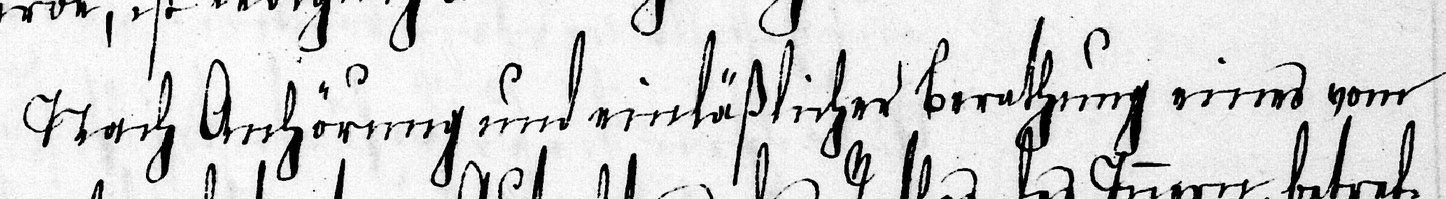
Nach Anhörung und einläßlicher Berathung eines vom
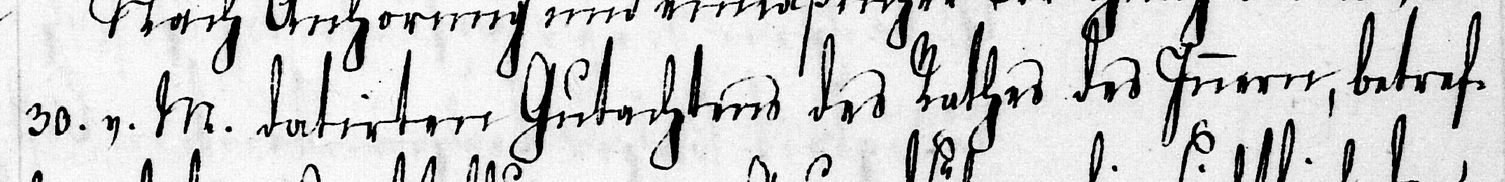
30. v. M. datirten Gutachtens des Rathes des Innern, betref¬
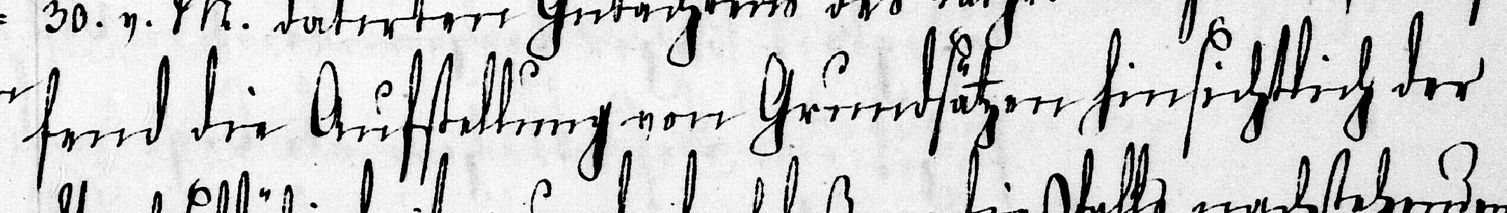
fend die Aufstellung von Grundsätzen hinsichtlich der
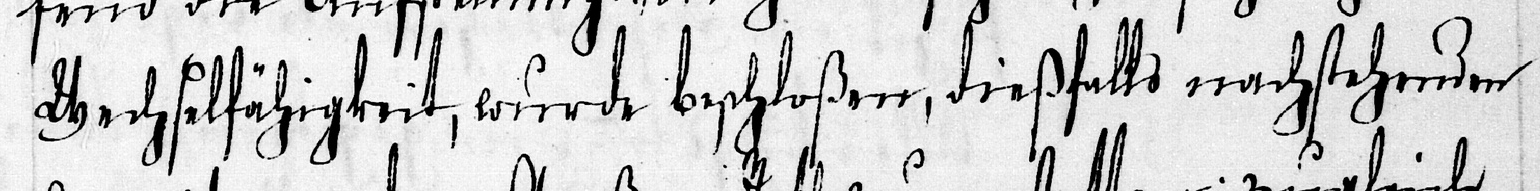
Wechselfähigkeit, wurde beschloßen, dießfalls nachstehenden
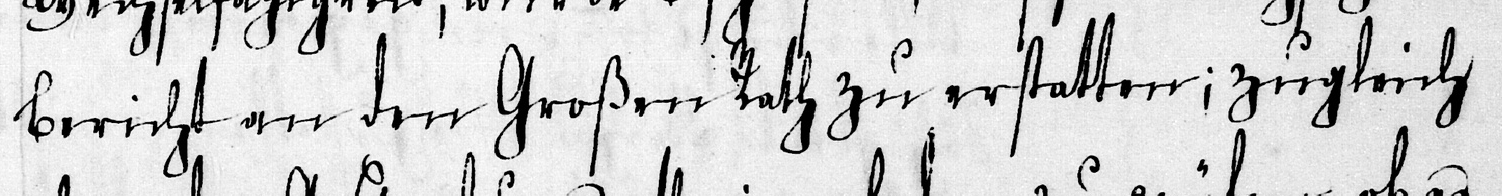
Bericht an den Großen Rath zu erstatten; zugleich
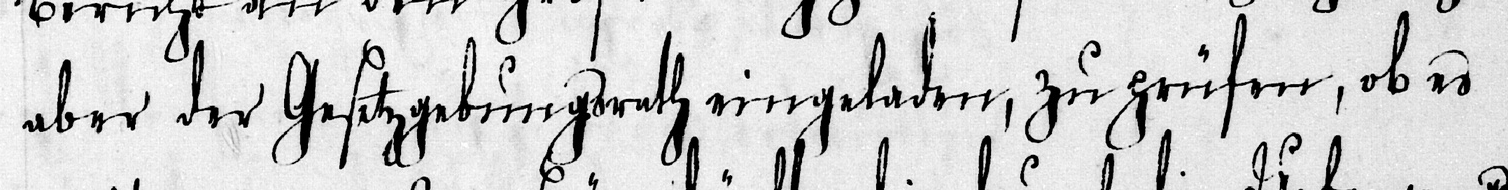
aber der Gesetzgebungsrath eingeladen, zu prüfen, ob es
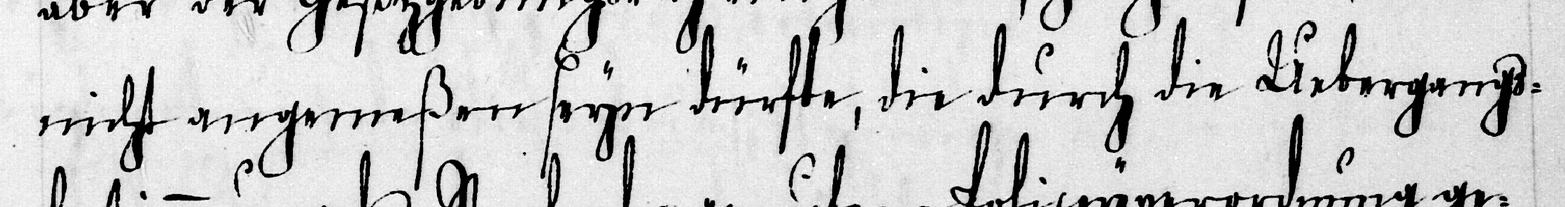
nicht angemeßen seyn dürfte, die durch die Uebergangs¬
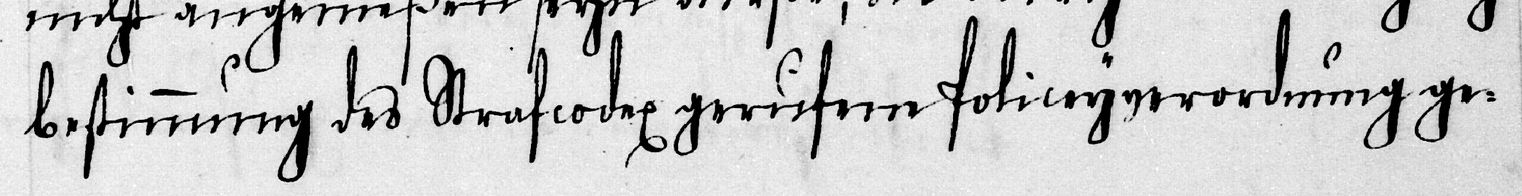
bestimmung des Strafcodex gerufene Policeyverordnung ge-
